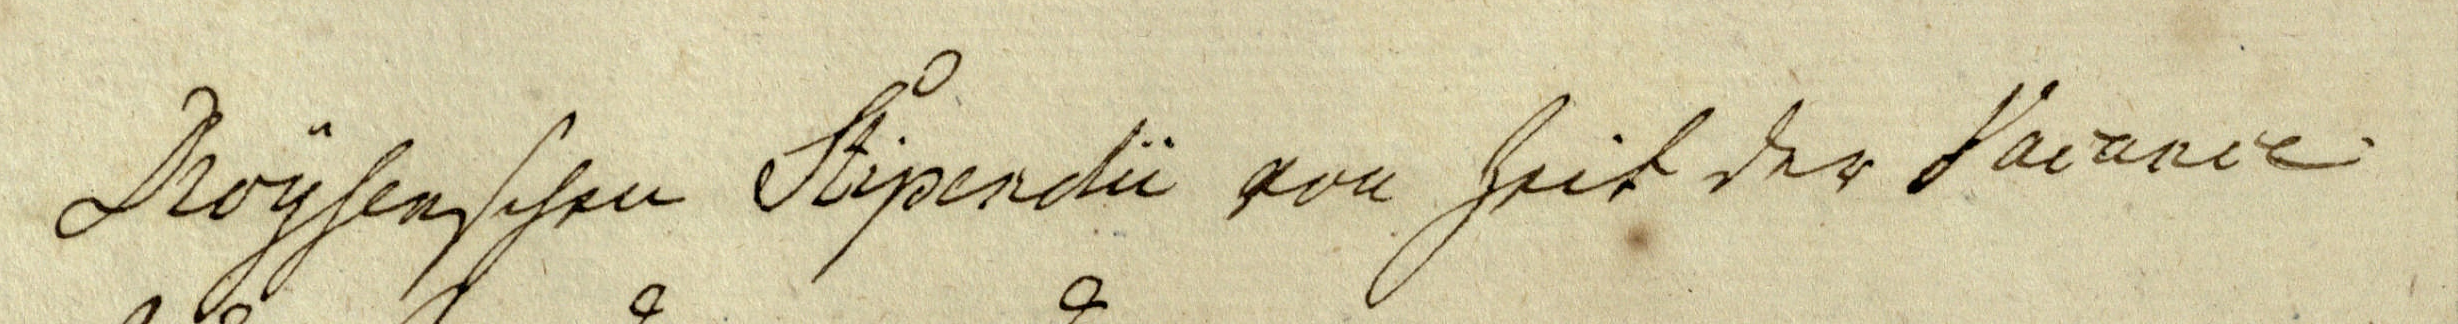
Droÿsenschen Stipendii von Zeit der Vacance
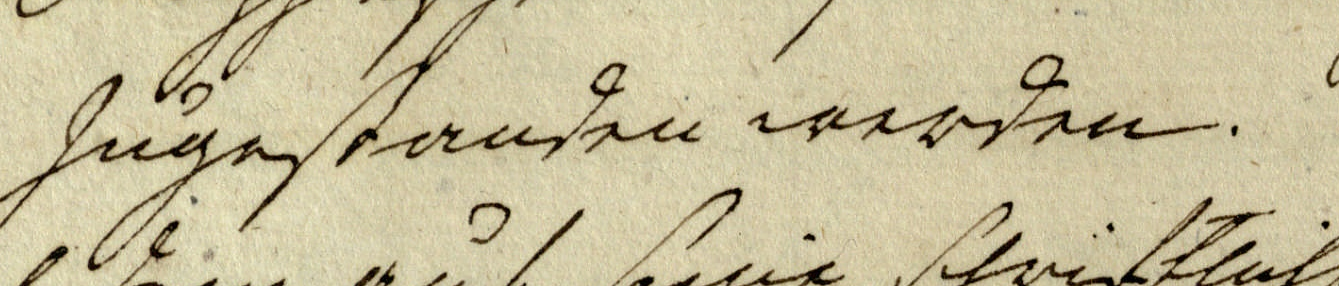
zugestanden werden.
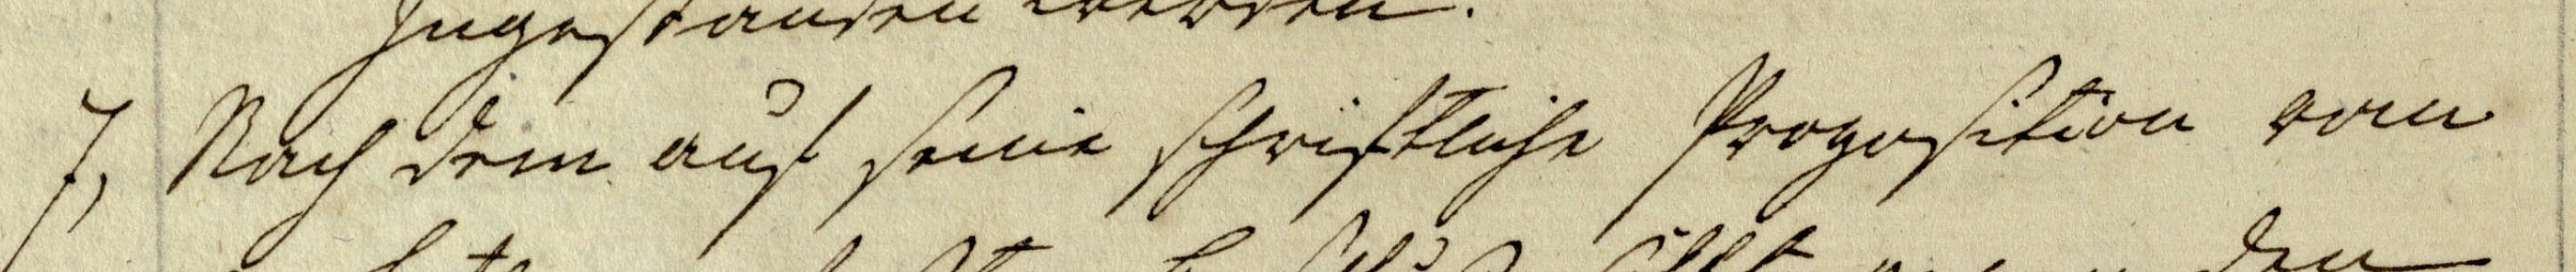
7., Nach dem auf seine schriftliche Proposition vom
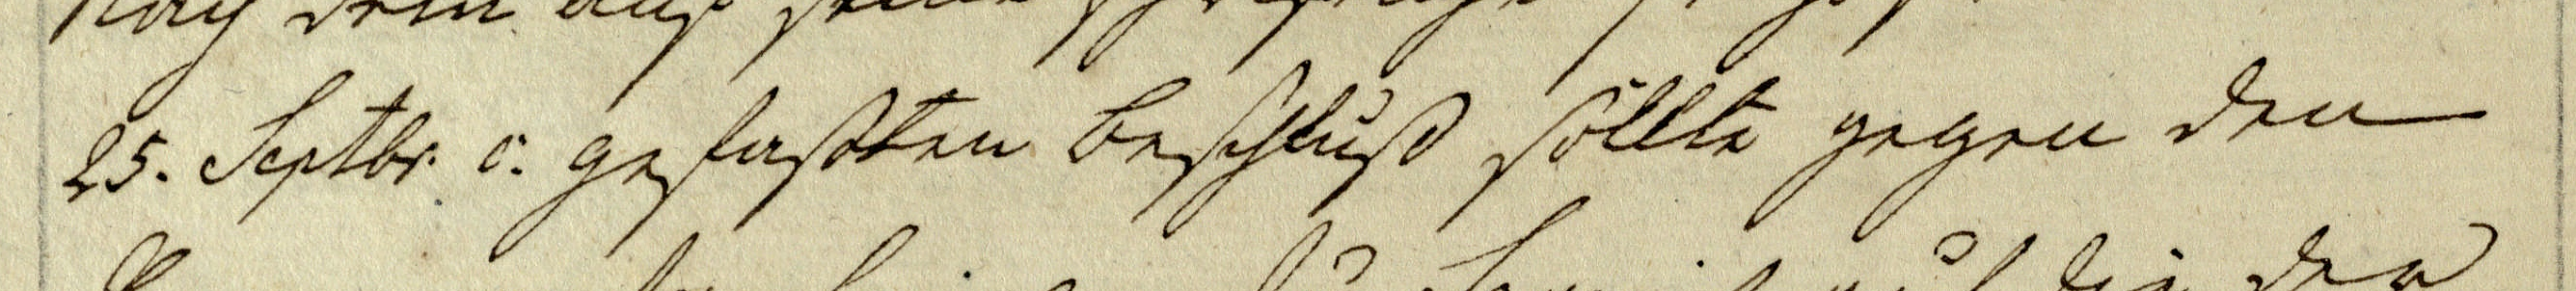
25. Septbr c. gefaßten Beschluß sollte gegen den
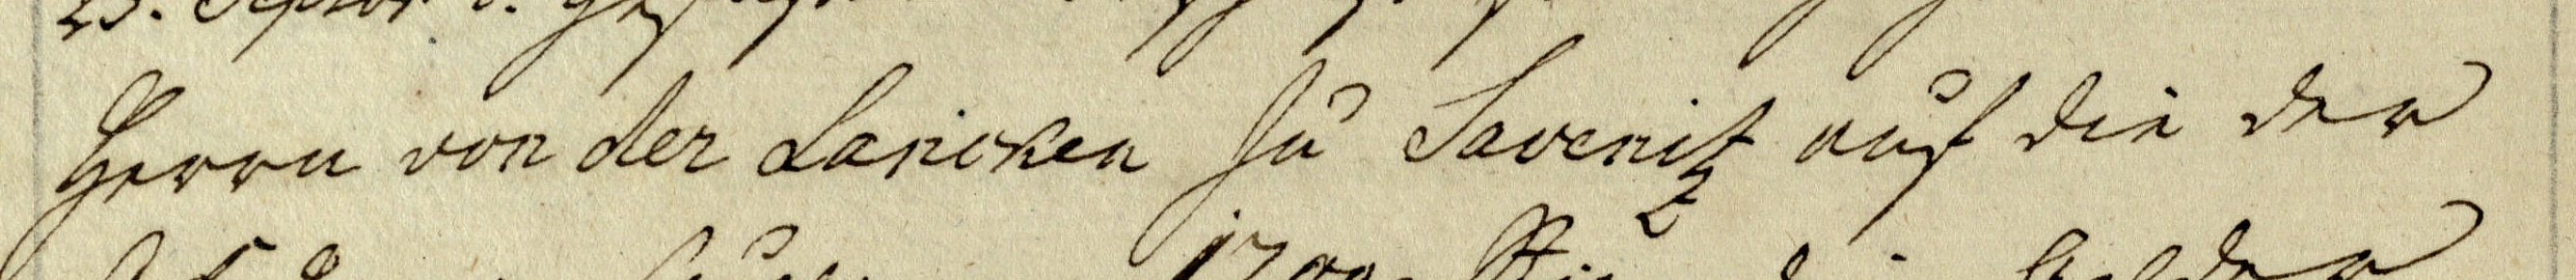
Herrn von der Lancken zu Savenitz auf die der
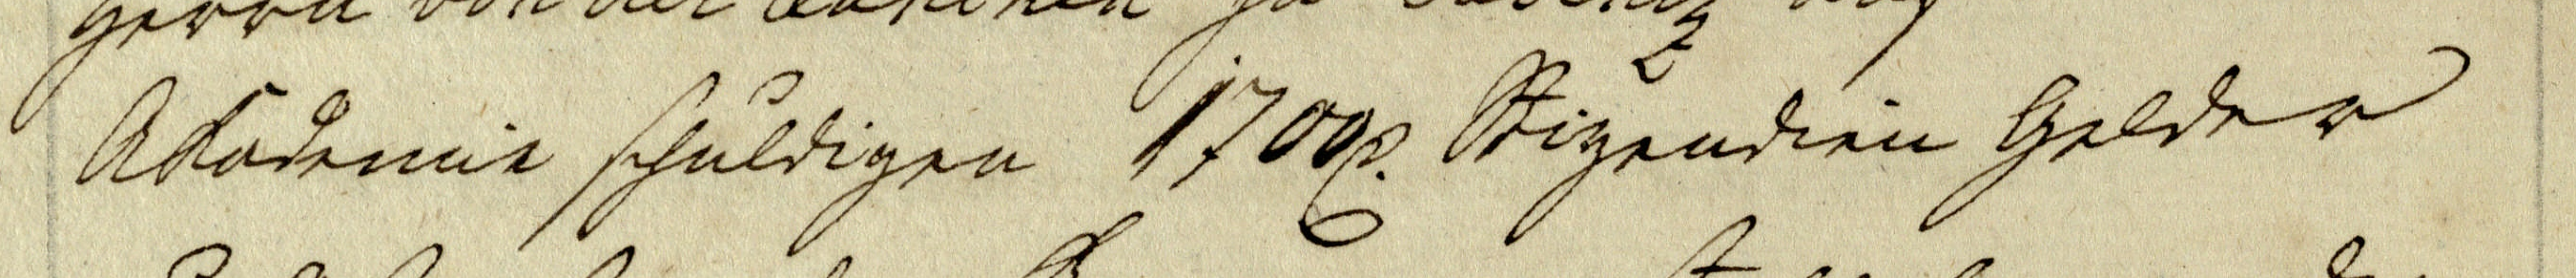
Akademie schuldigen 1700 l. Stipendien Gelder
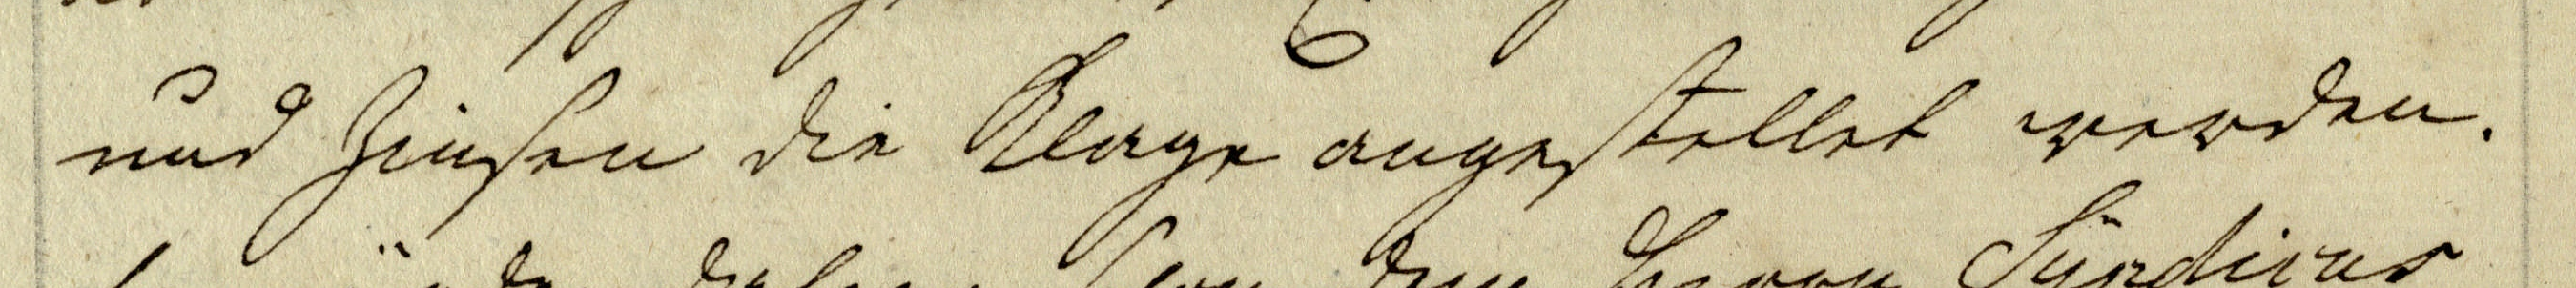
und Zinsen die Klage angestellet werden.
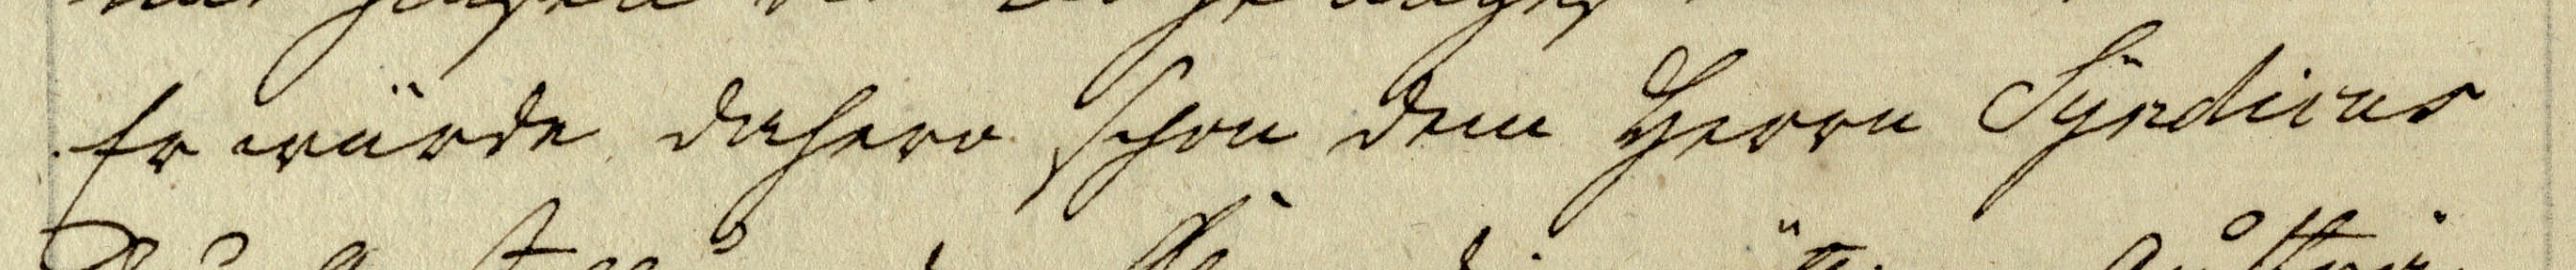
Er würde dahero schon dem Herrn Sÿndicus
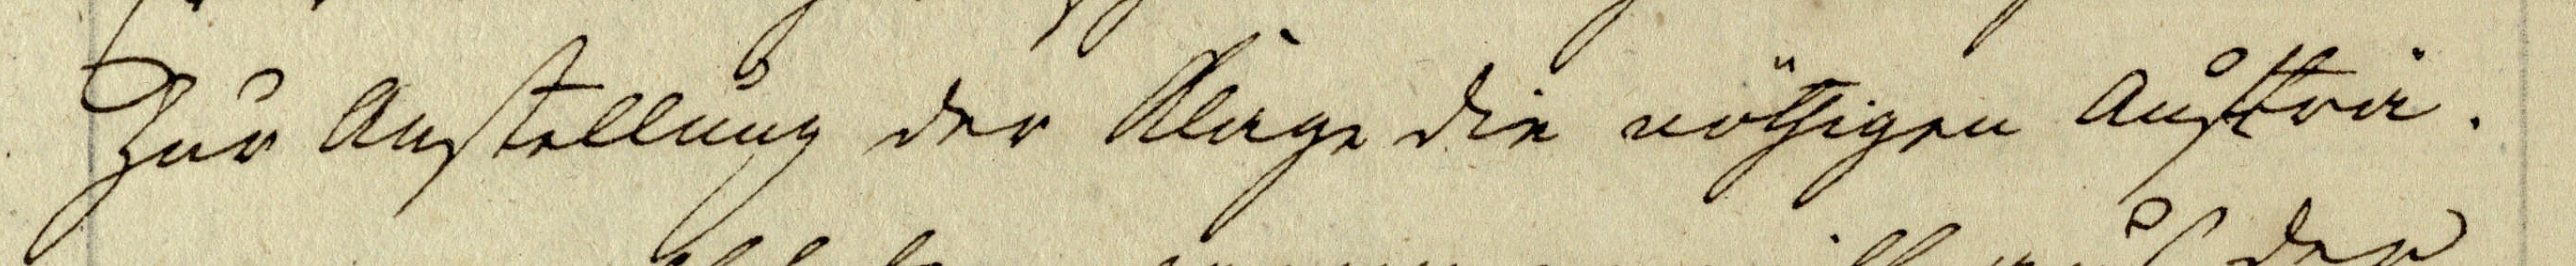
zur Anstellung der Klage die nöthigen Aufträ¬
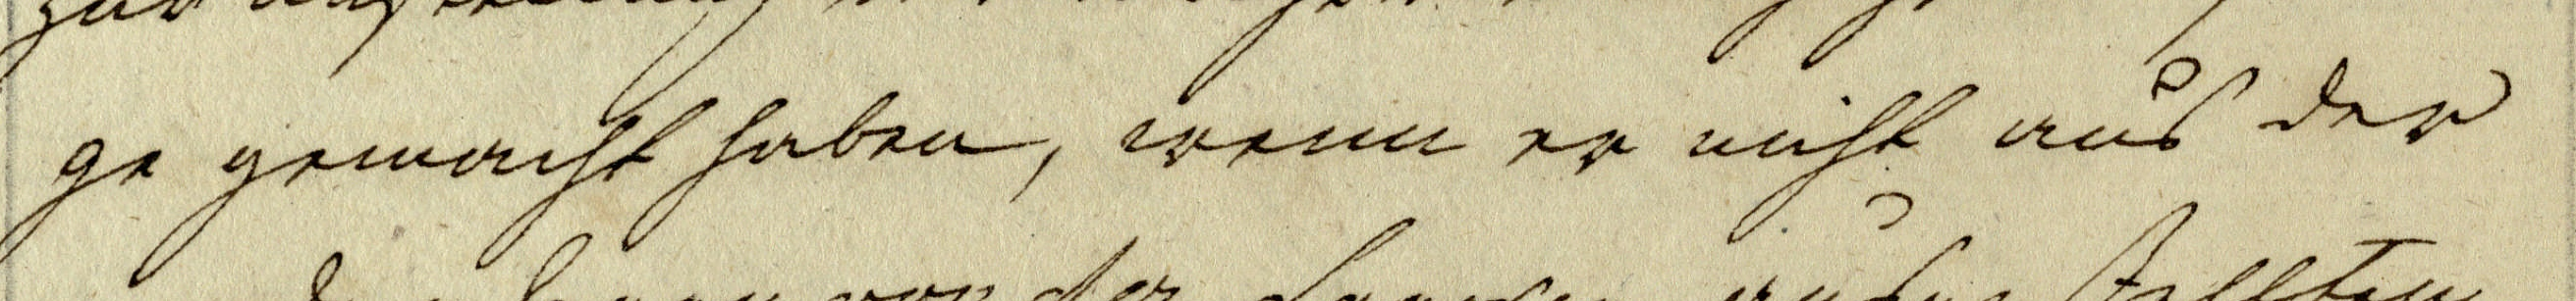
ge gemacht haben, wenn er nicht aus der
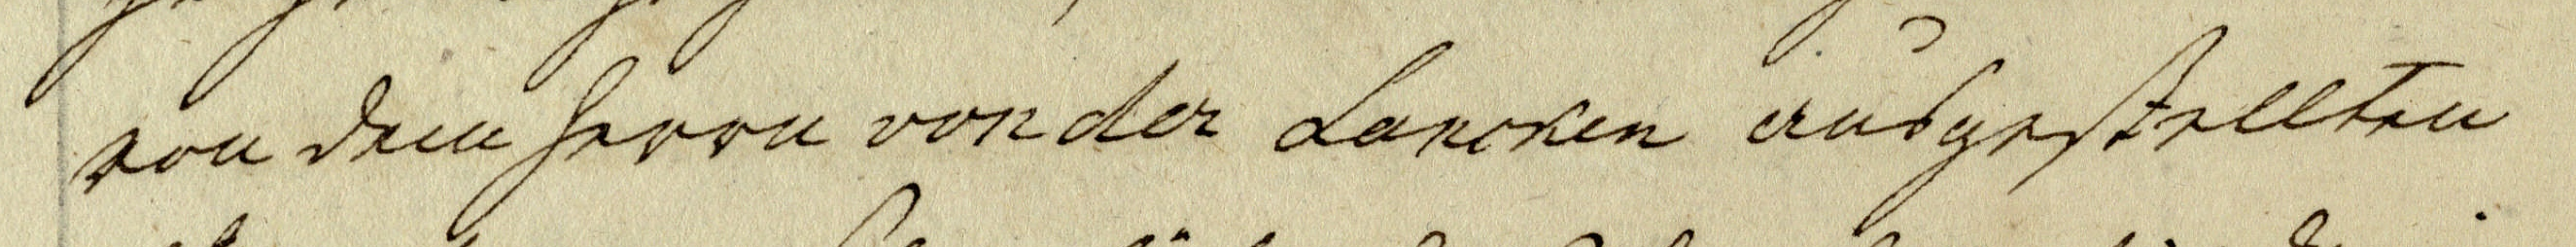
von dem Herrn von der Lancken ausgestellten
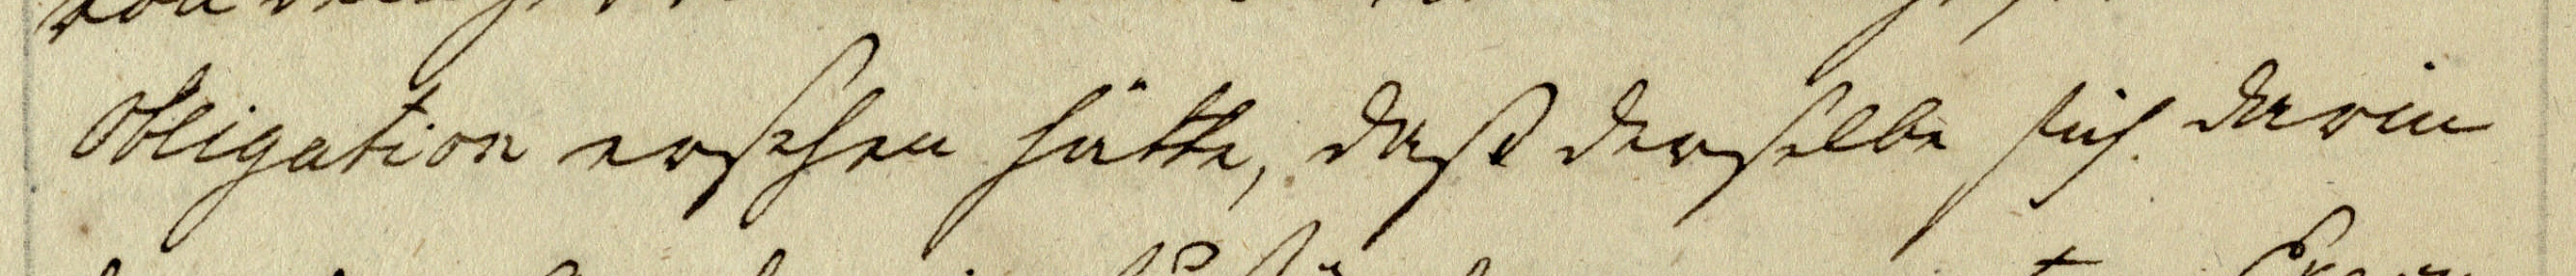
Obligation ersehen hätte, daß derselbe sich, darin
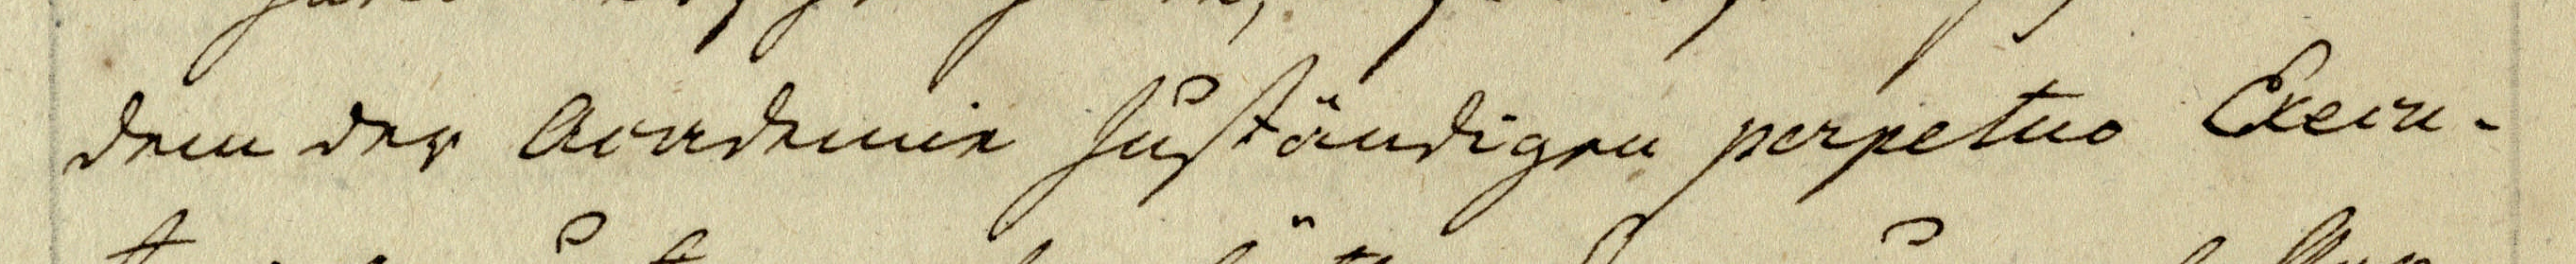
dem der Academie zuständigen perpetuo Execu¬
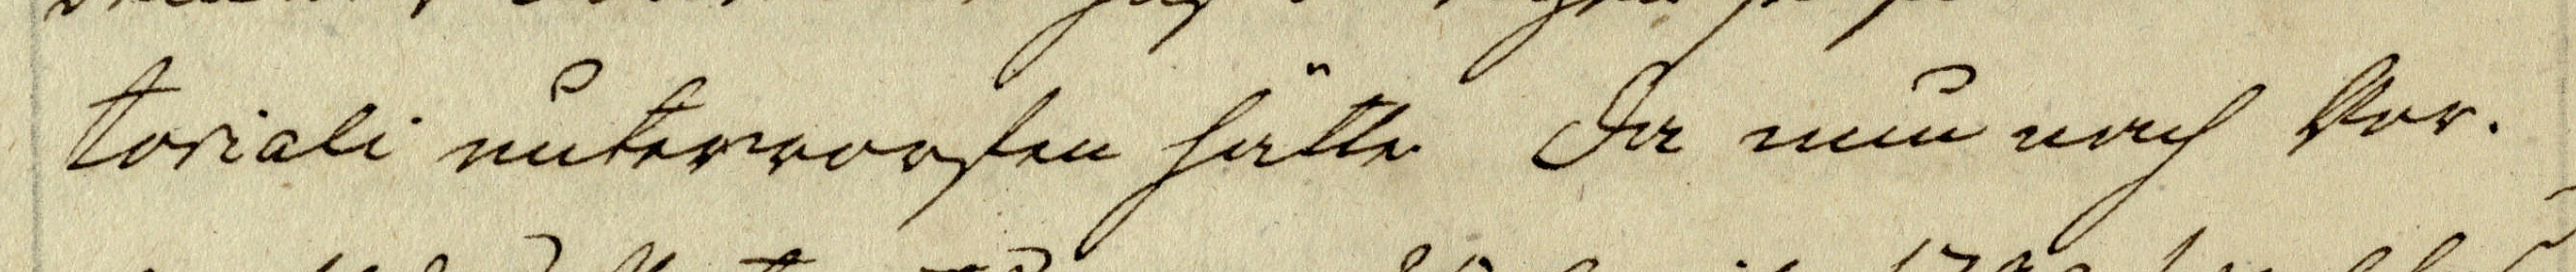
toriali unterworfen hätte. Da nun nach Vor¬
